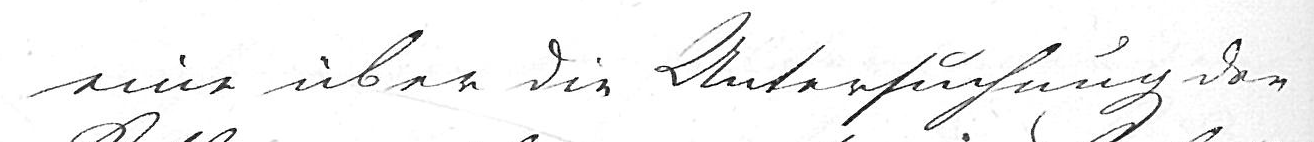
eine über die Untersuchung der
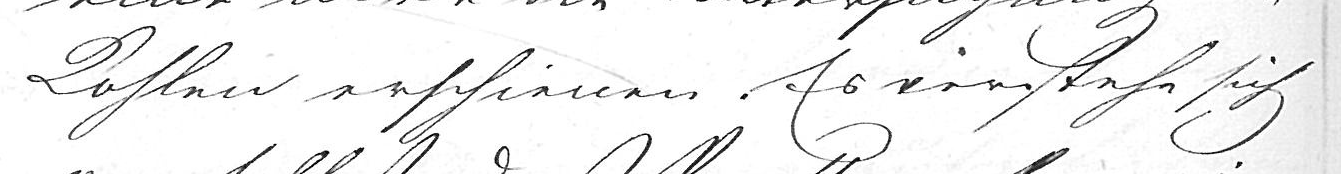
Kohlen erschienen. Es verstehe sich
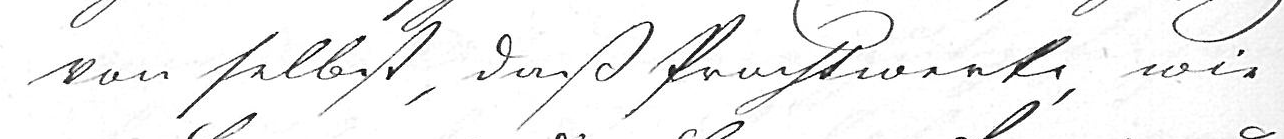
von selbst, daß Prachtwerke, wie
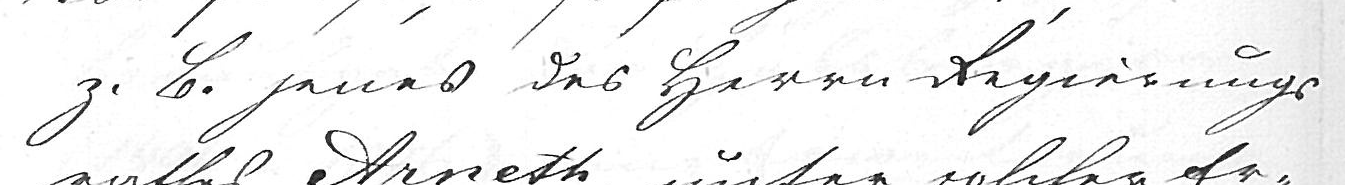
z. B. jenes des Herrn Regierungs-
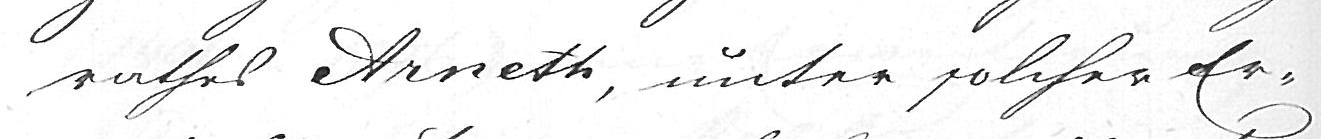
rathes Arneth, unter solcher Er-
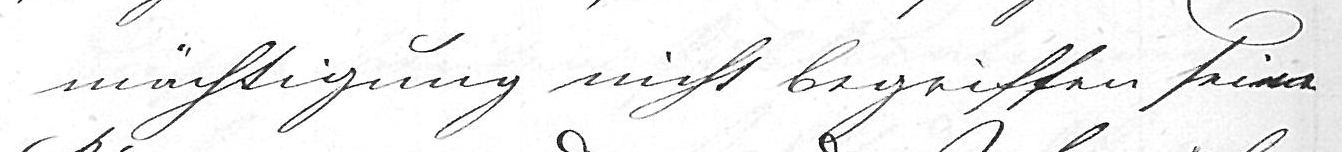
mächtigung nicht begriffen sein
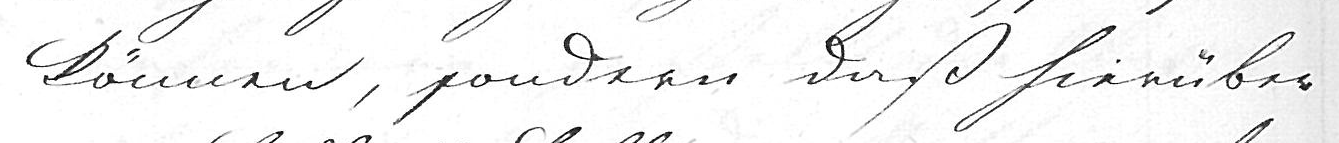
können, sondern daß hierüber
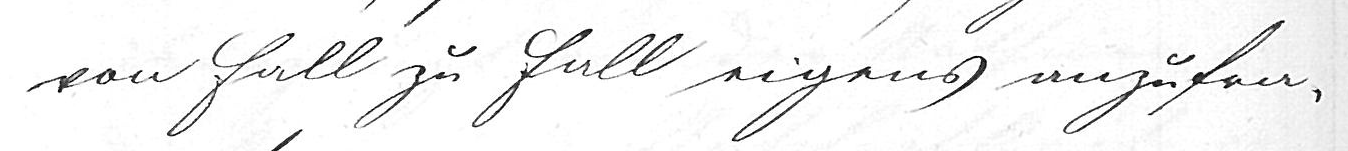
von Fall zu Fall eigens anzufra-
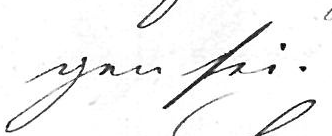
gen sei.
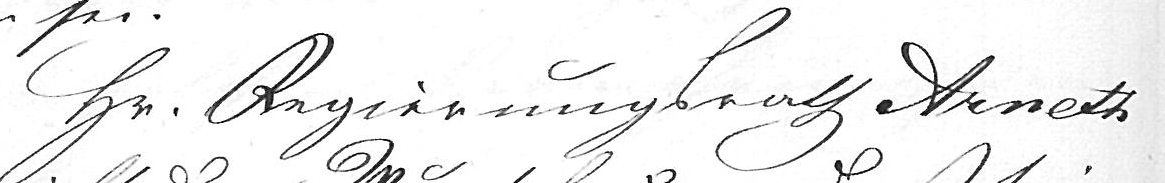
Hr. Regierungsrath Arneth
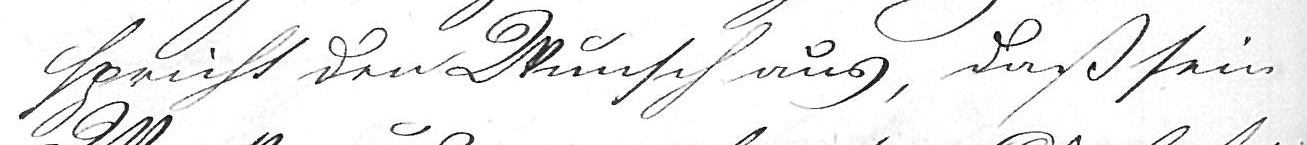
spricht den Wunsch aus, daß sein
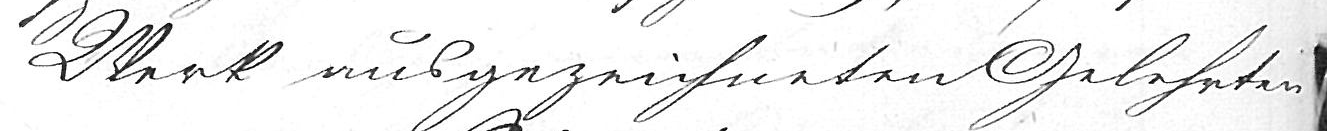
Werk ausgezeichneten Gelehrten
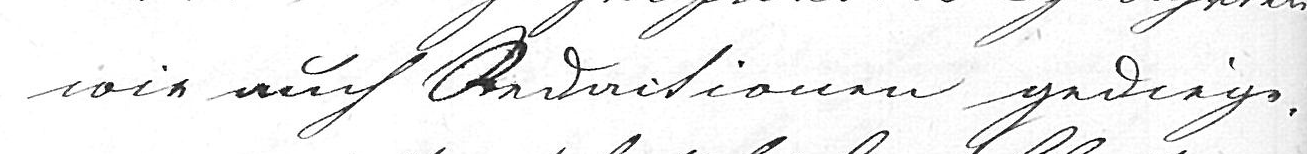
wie auch Redactionen gediege-
